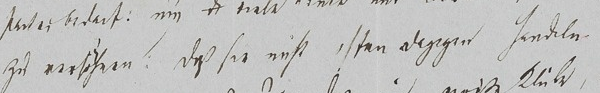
zu versöhnen: daß sie nicht offen dagegen handeln.
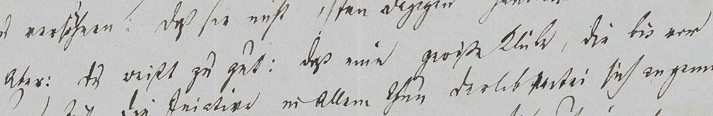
Aber: du weißt zu gut: daß eine gewisse Klicke die bis vor
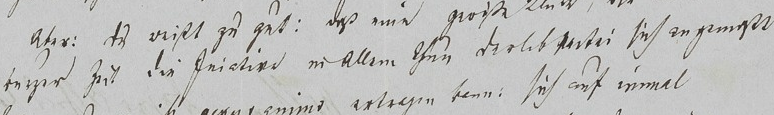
kurzer Zeit die Initiative in Allem Thun der lib Partei sich angemaßt
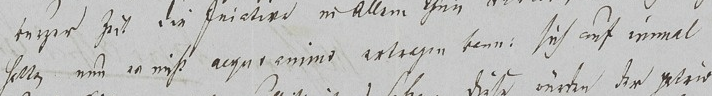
hatte nun es nicht aequi animo ertragen kann: sich auf einmal
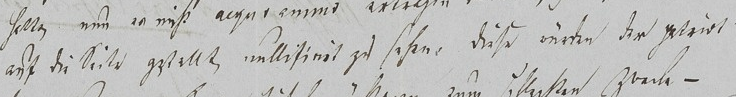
auf die Seite gestellt, nullisiert zu sehen: diese würden der patriot.
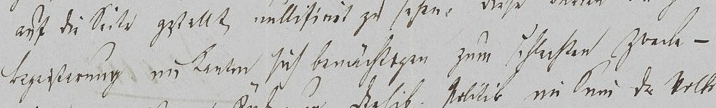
Begeisterung im Kanton sich bemächtigen zum schlechten Zwecke
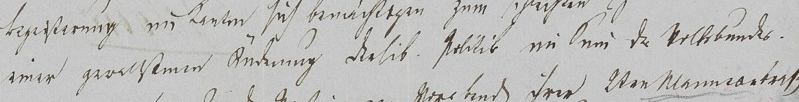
einer gewaltsamen Änderung die lib. Politik im Sinn des Volksbundes
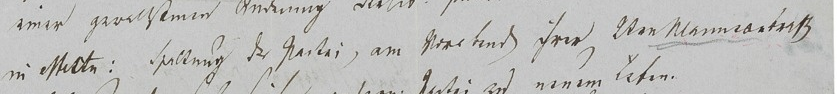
in affecte/effecte: Spaltung der Partei, am Vorabend ihrer 2ten ...antritt
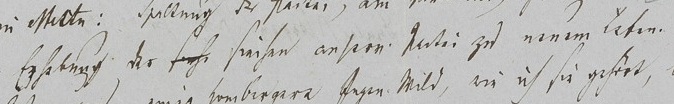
Erhebung der sieh siechen conserv. Partei zu neuem Leben.
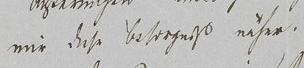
mir diese Besorgniß näher.
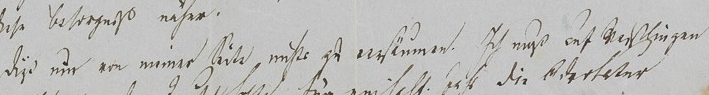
Dieß um von meiner Seite nichts zu versäumen. Ich muß auf Weißlingen
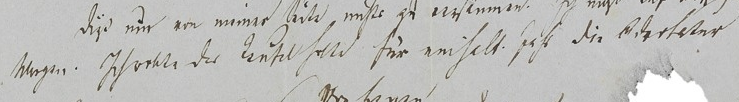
Morgen. Ich wollte der Teufel holte für ein halb. Jahr die Advokatur
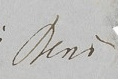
Beni
